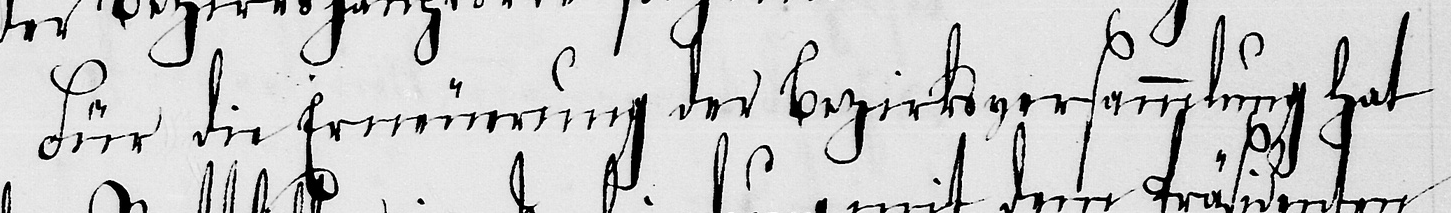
Für die Erneuerung der Bezirksversammlung hat
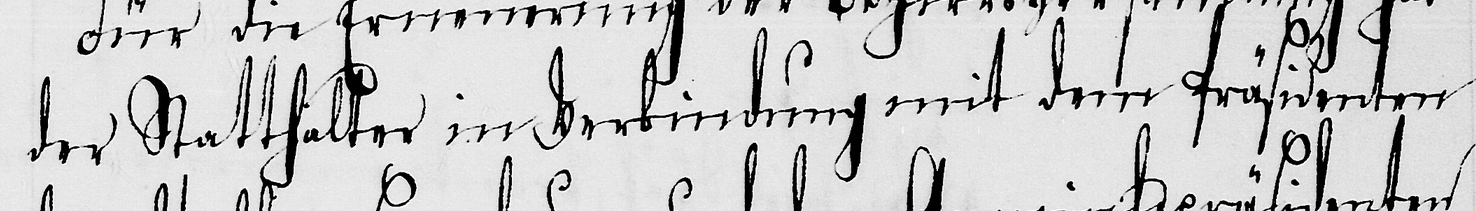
der Statthalter in Verbindung mit dem Präsidenten
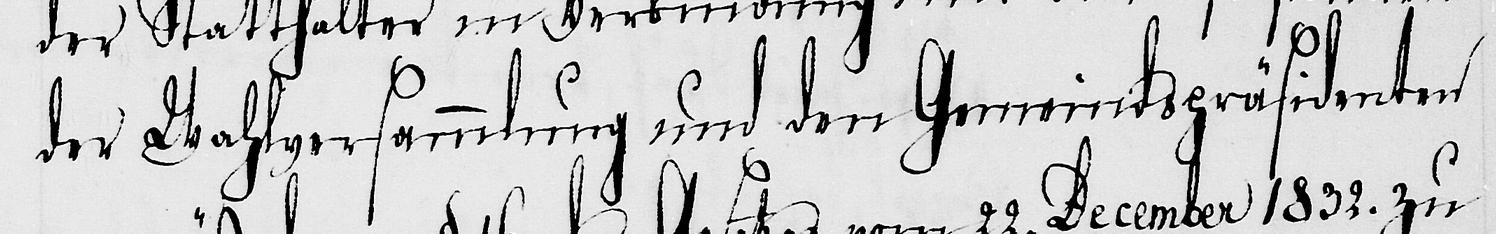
der Wahlversammlung und den Gemeindspräsidenten
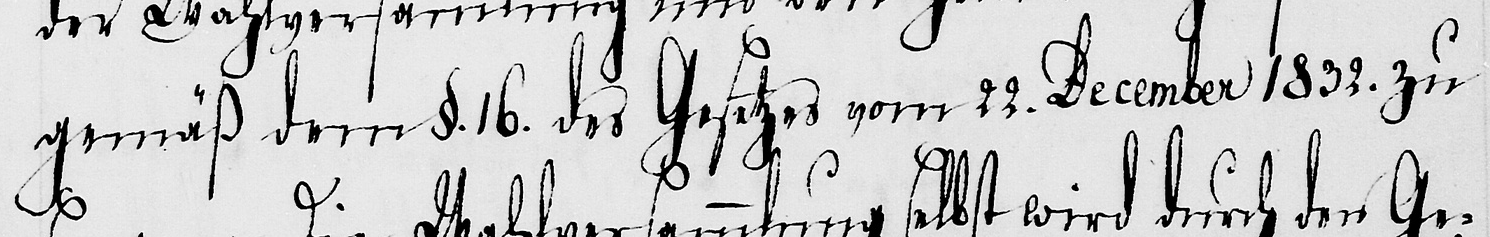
gemäß dem §. 16. des Gesetzes vom 22. December 1832. zu
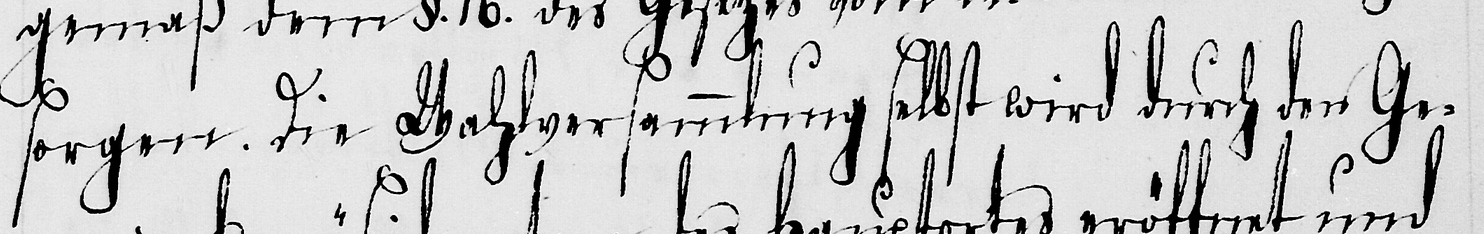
sorgen. Die Wahlversammlung selbst wird durch den Ge¬
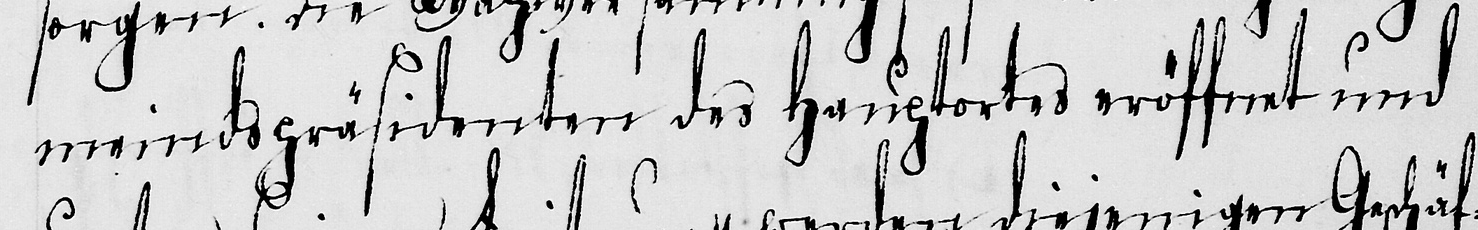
meindspräsidenten des Hauptortes eröffnet und
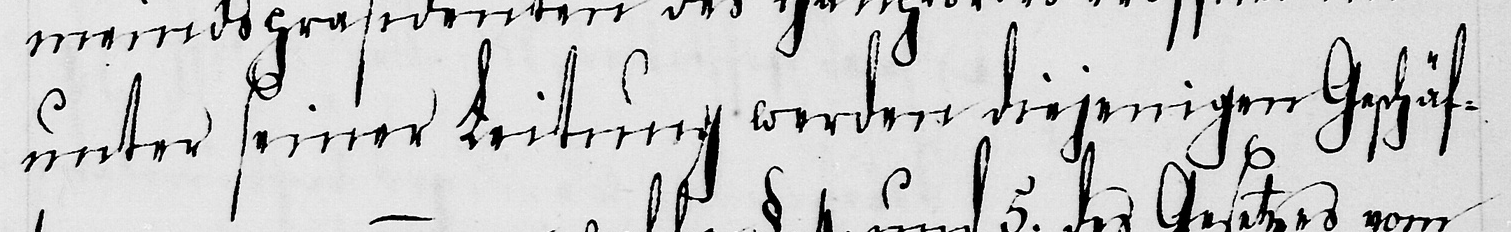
unter seiner Leitung werden diejenigen Geschäf¬
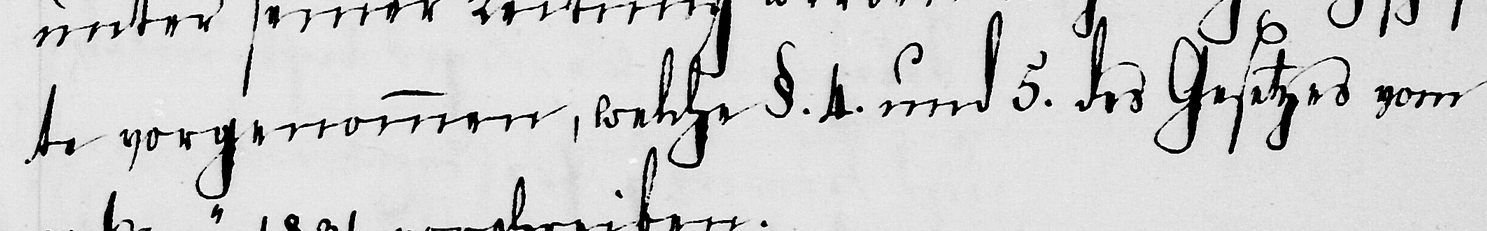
te vorgenommen, welche §. 4. und 5. des Gesetzes vom
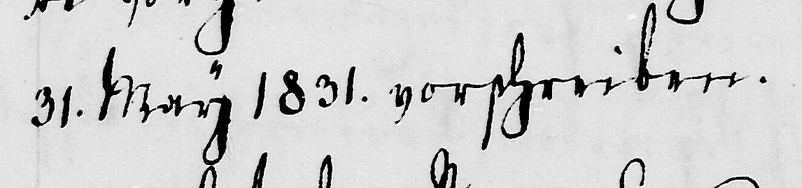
31. May 1831. vorschreiben.
